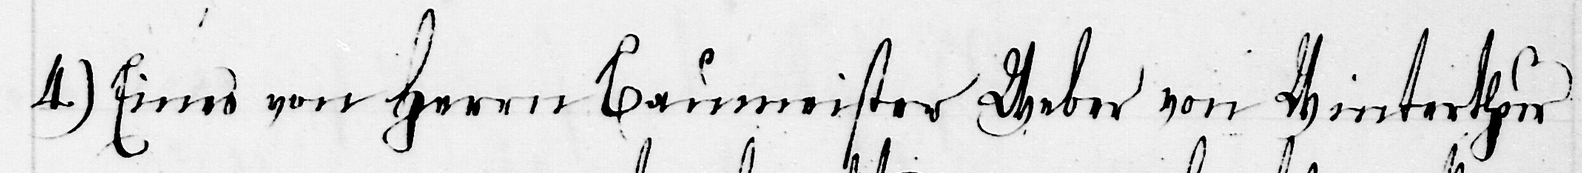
4.) Eines von Herrn Baumeister Weber von Winterthur
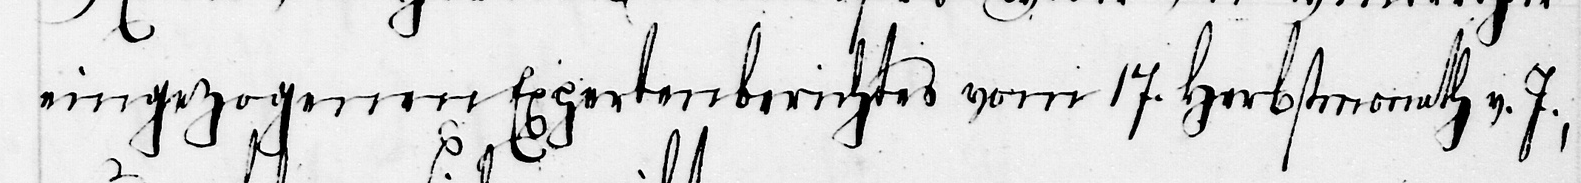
eingezogenen Expertenberichtes vom 17. Herbstmonath v. J.,
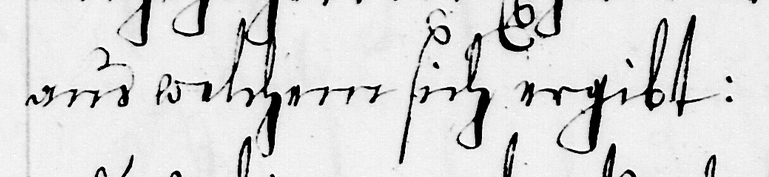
aus welchem sich ergibt:
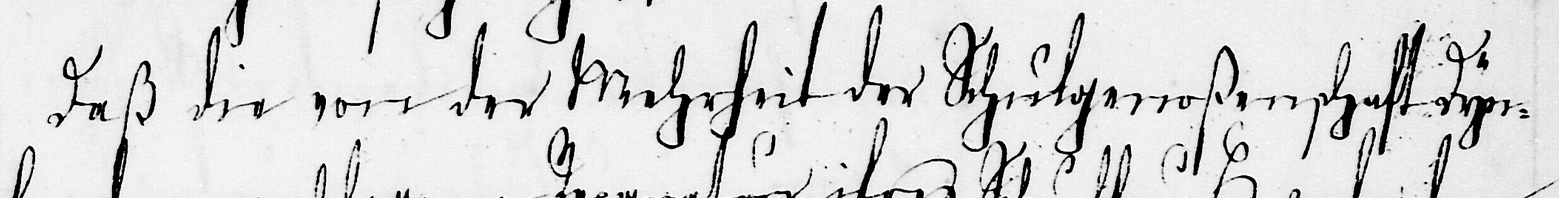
Daß die von der Mehrheit der Schulgenoßenschaft Dyn¬
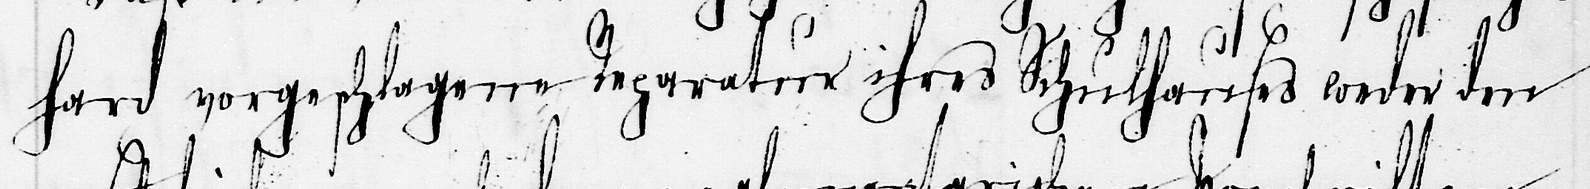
hard vorgeschlagene Reparatur ihres Schulhauses weder den
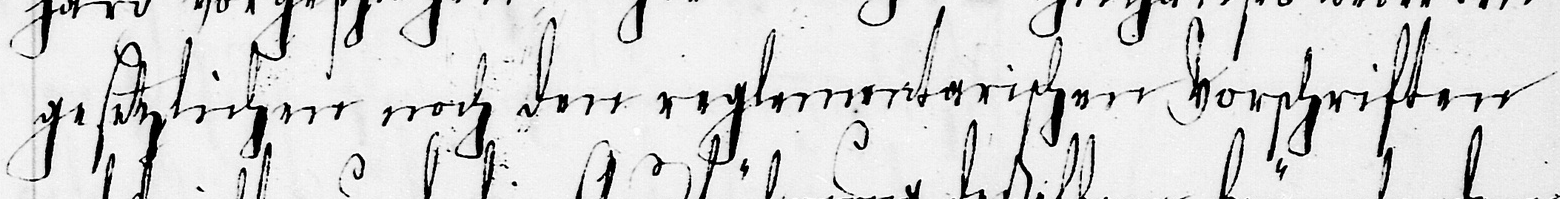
gesetzlichen noch den reglementarischen Vorschriften
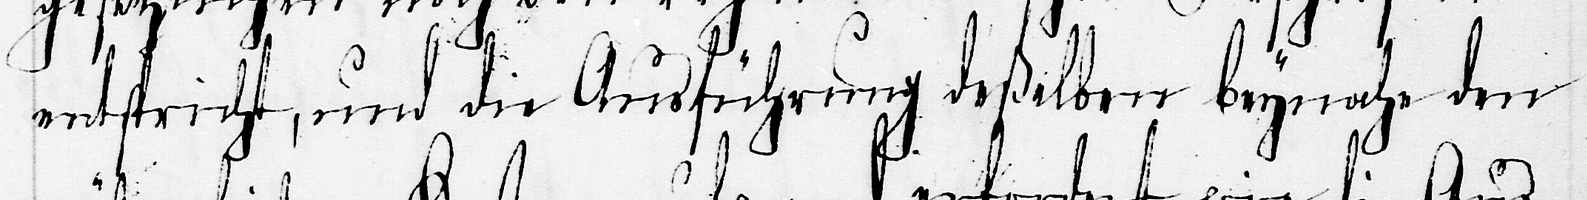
entspricht, und die Ausführung deßelben beynahe den
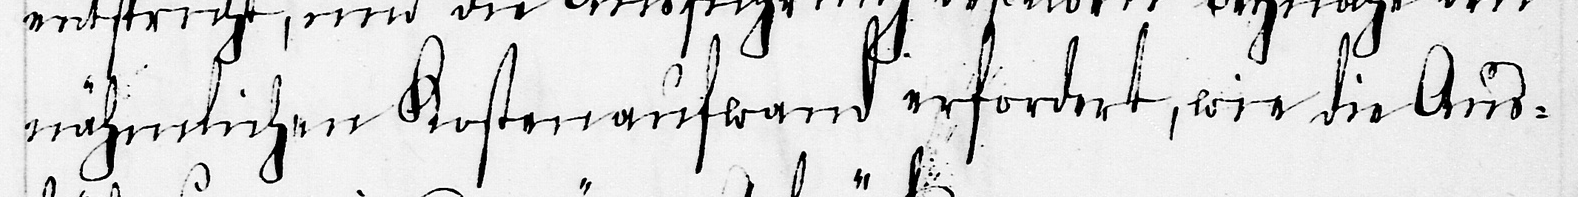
nähmlichen Kostenaufwand erfordert, wie die Aus¬
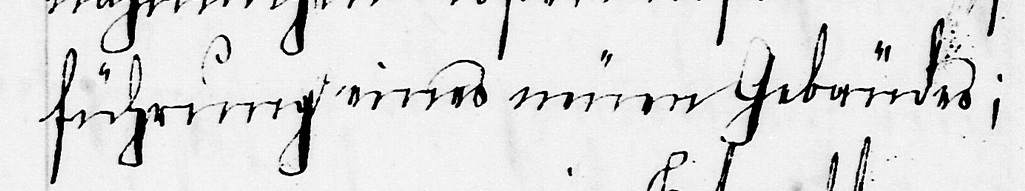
führung eines neuen Gebäudes;
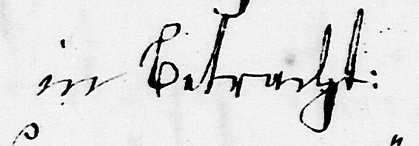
in Betracht:
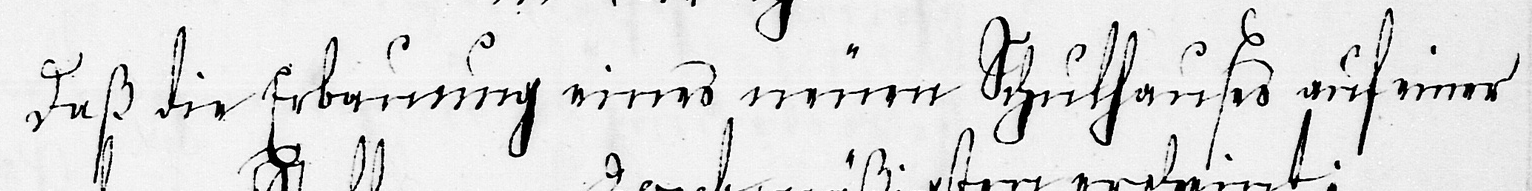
Daß die Erbauung eines neuen Schulhauses auf einer
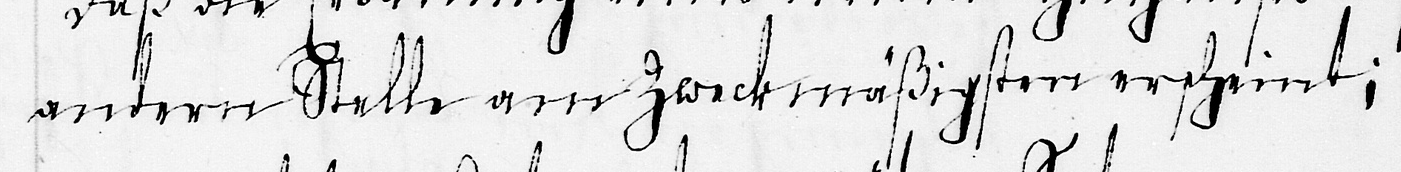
andern Stelle am Zweckmäßigsten erscheint;
